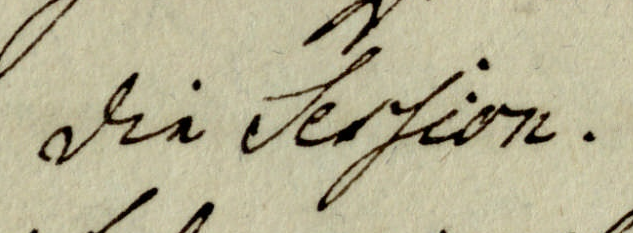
die Session.
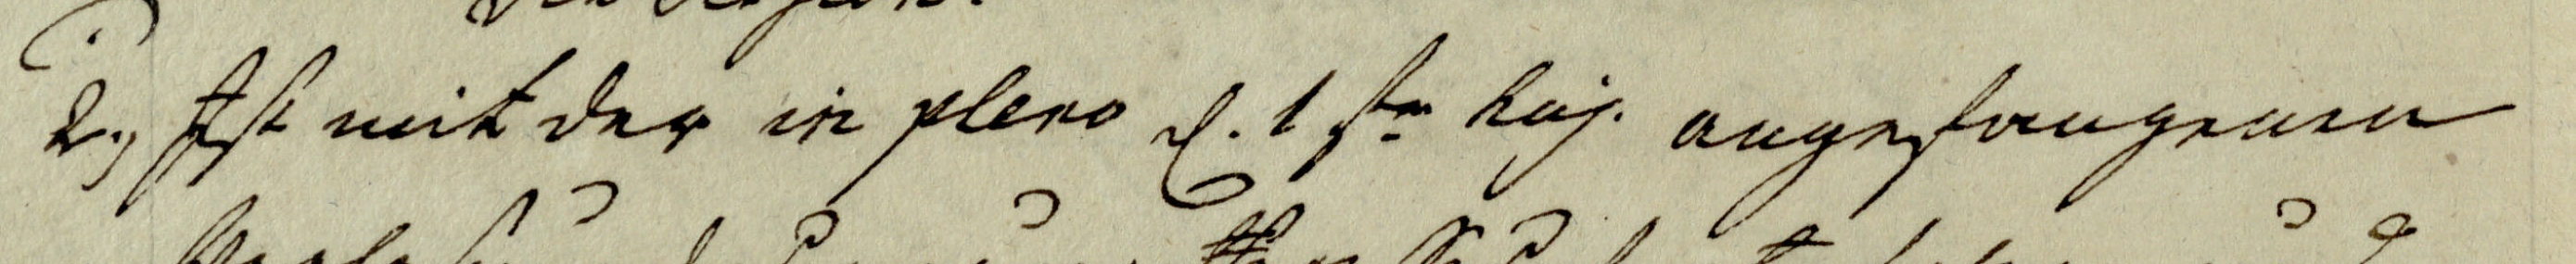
2., Ist mit der in pleno d. 1 sten huj. angefangenen
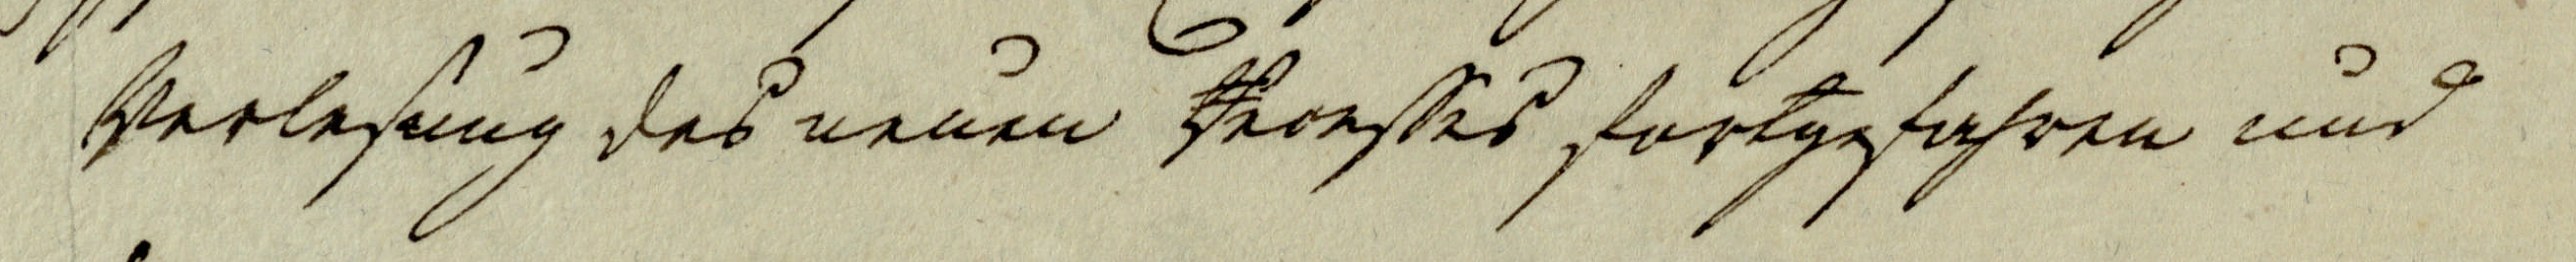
Vorlesung des neuen Recesses fortgefahren und
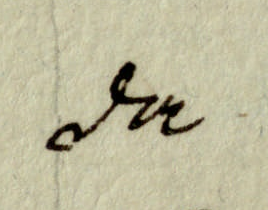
da
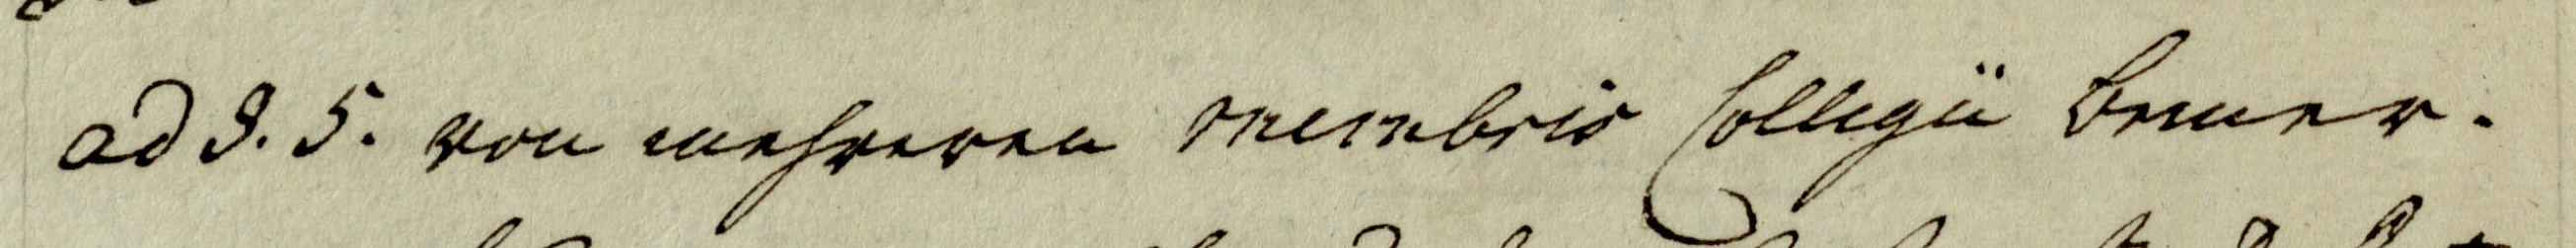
ad §. 5. von mehreren Membris Collegii Bemer-
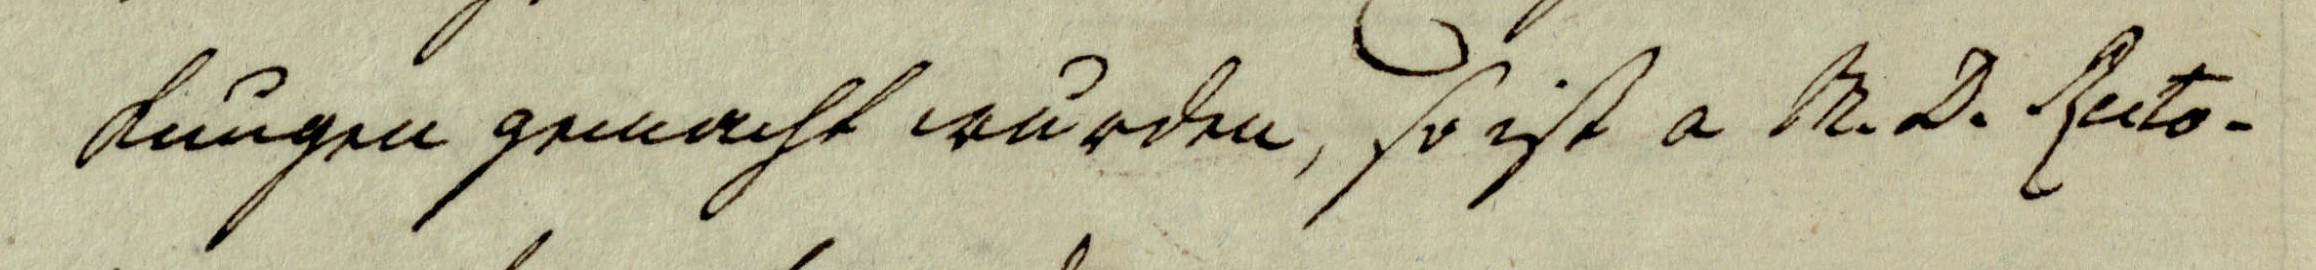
kungen gemacht wurden, so ist a M. D. Recto¬
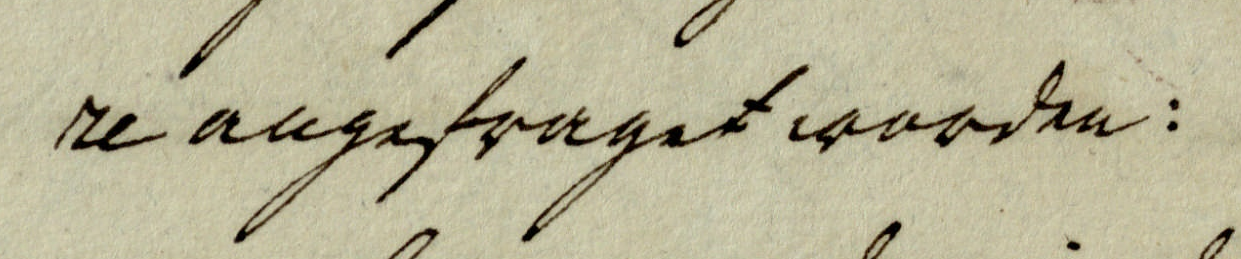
re angefraget worden:
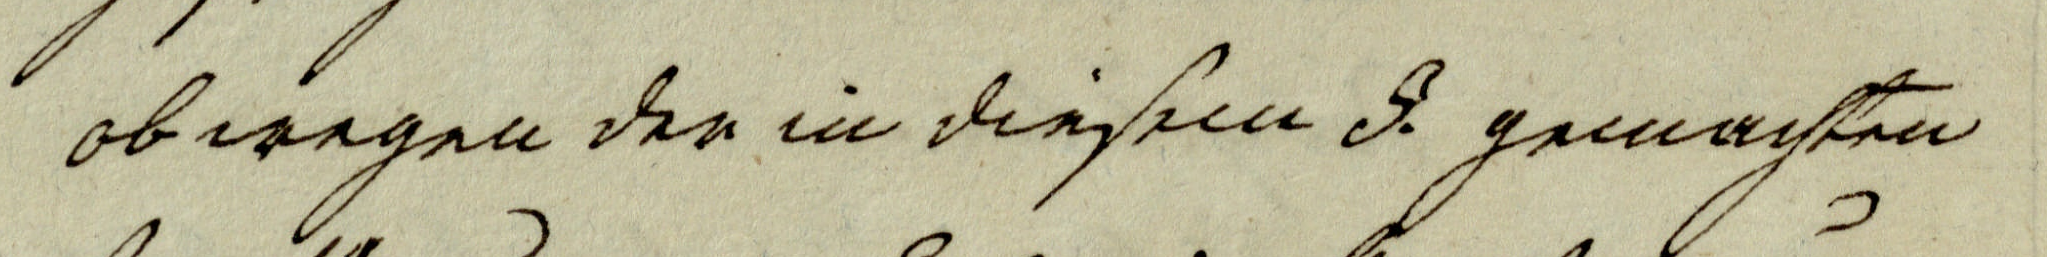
ob wegen der in diesem §. gemachten
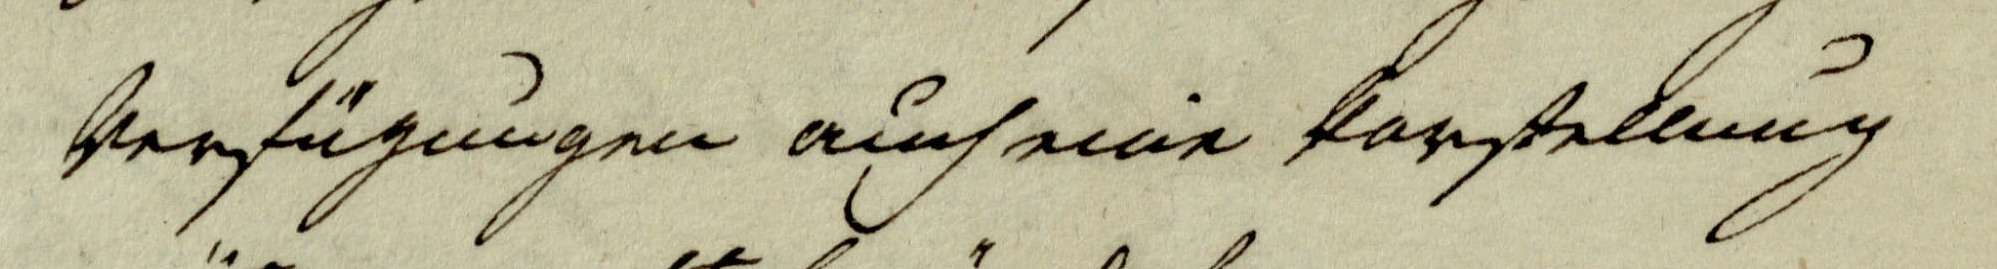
Verfügungen auch eine Vorstellung
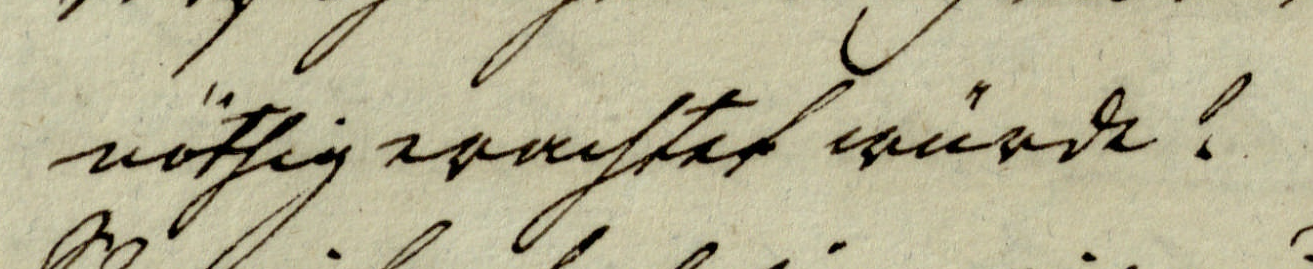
nöthig erachtet würde?
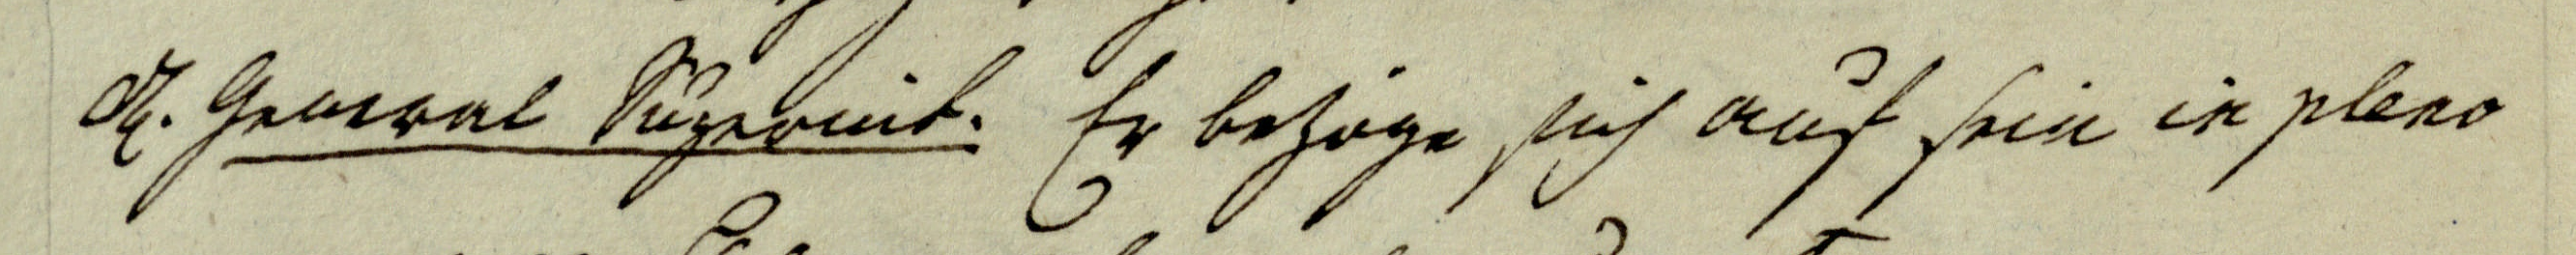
dh. General Superint. Er bezöge sich auf sein in pleno
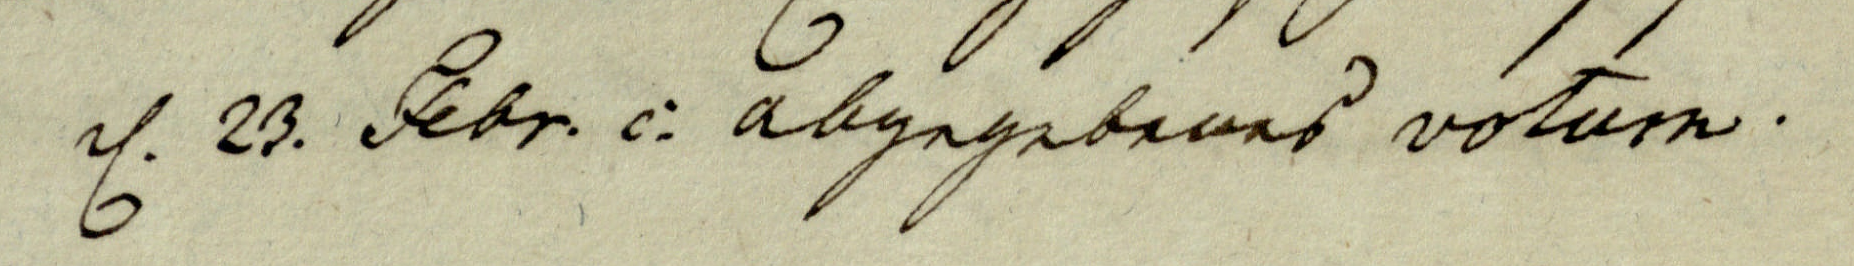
d. 23. Febr. c. abgegebenes votum.
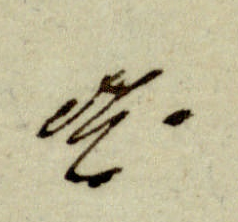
dh.
